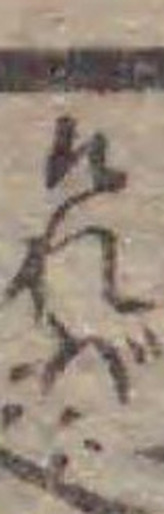ければ
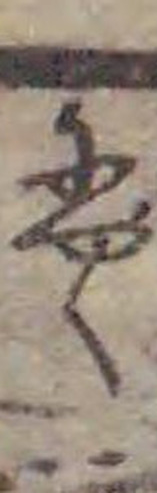にやく
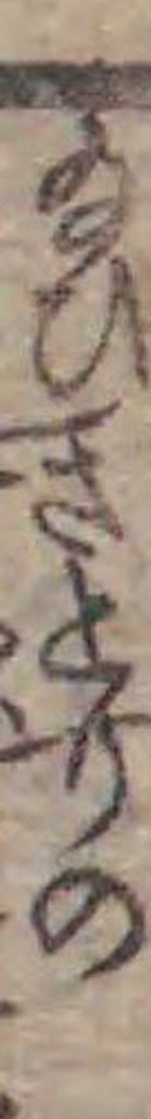給ひさとりの
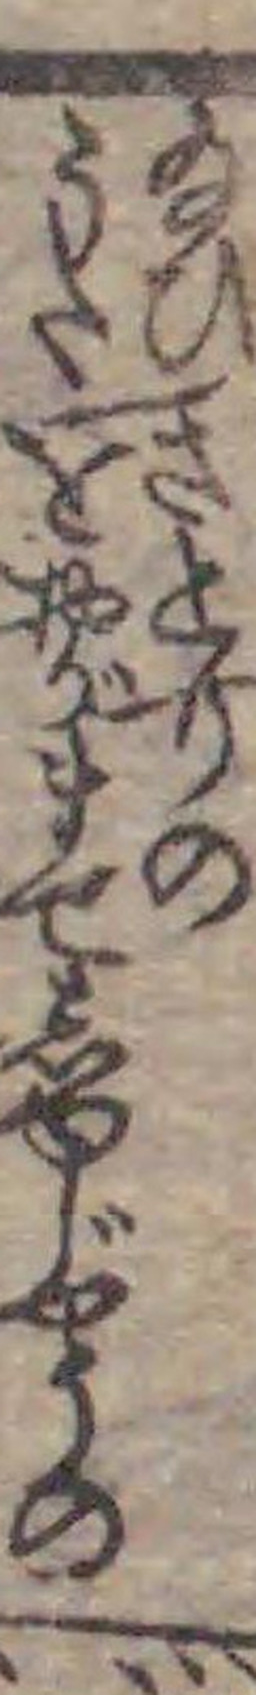うたをおがませしゆじやうの
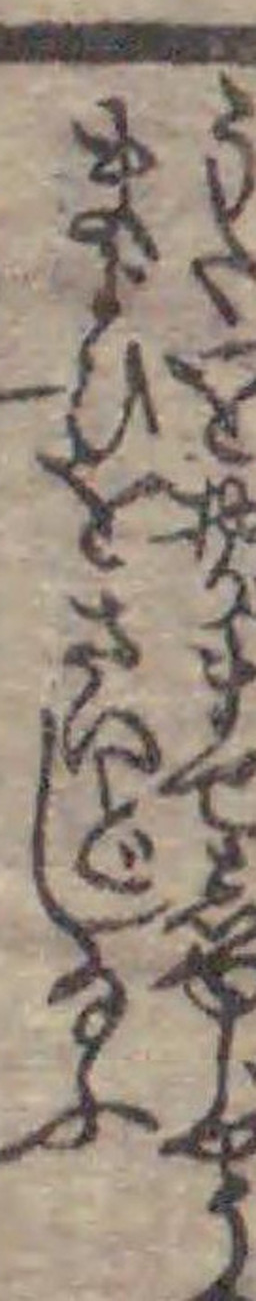まよひをさいどし給ふ
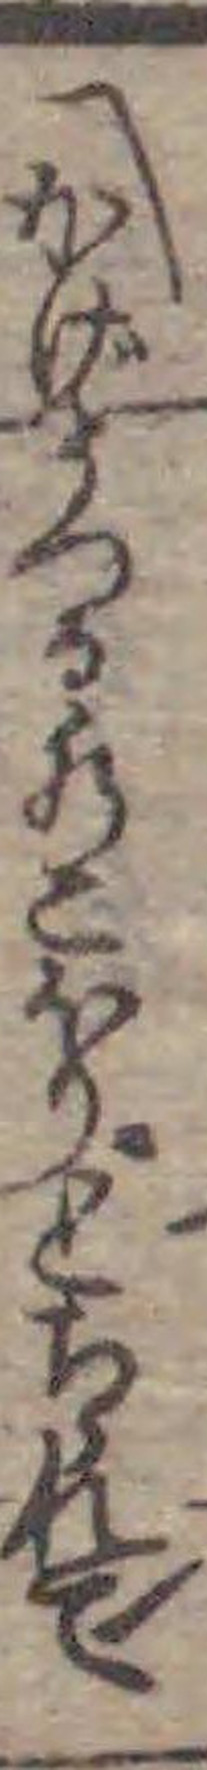〽かげうつる水こほりにとちられて
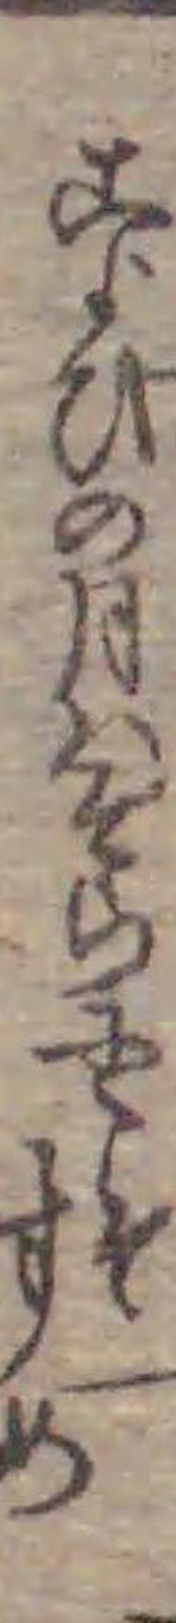こよひの月はそらにこそ

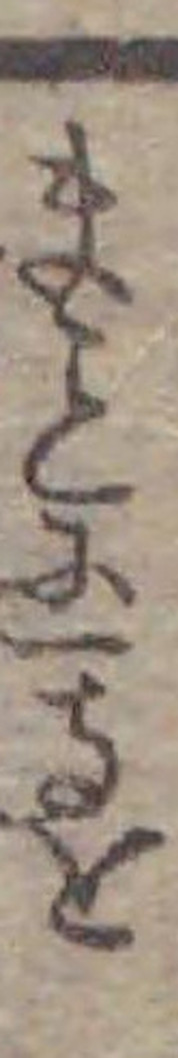まことに一寺を
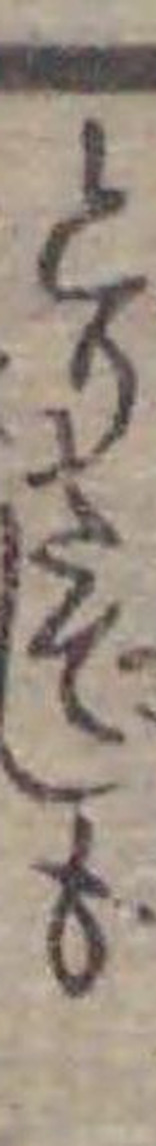とりたてしも
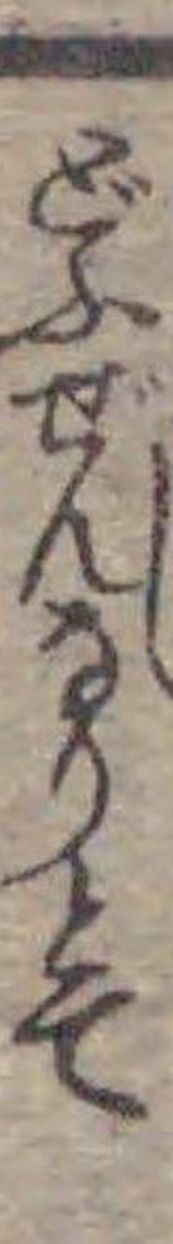どふぜんなりとて
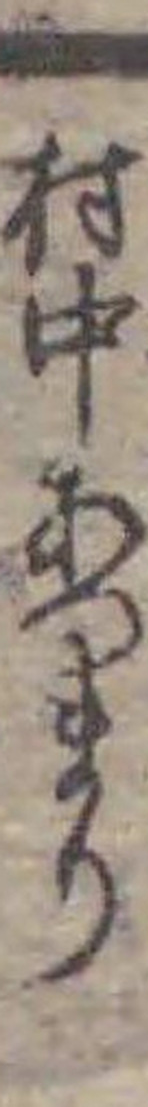村中あつまり
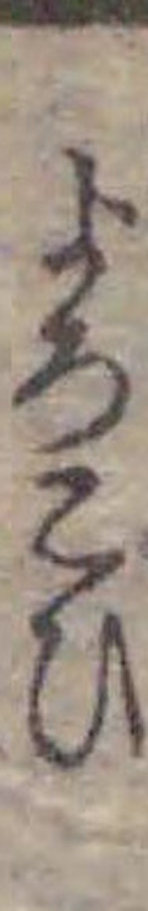よろこひ
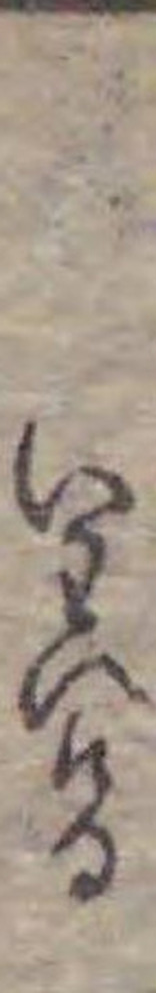いわいける
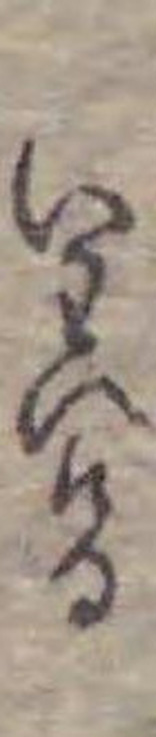いわいける
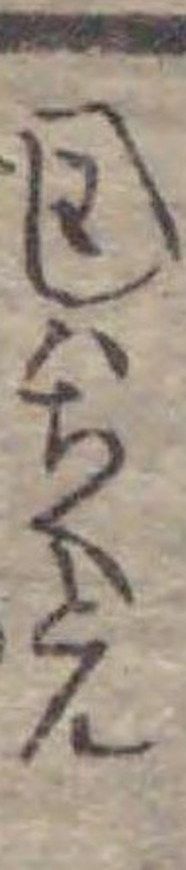〽わしはちくとん
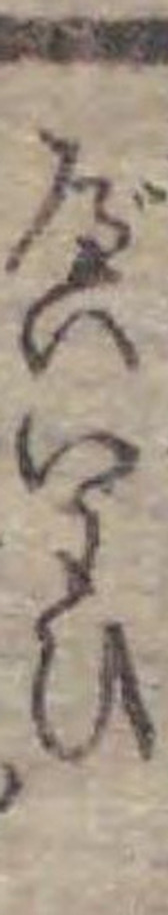べいいわい
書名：歌の化物一寺再興 : 2巻
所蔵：国立国会図書館 National Diet Library, JAPAN
